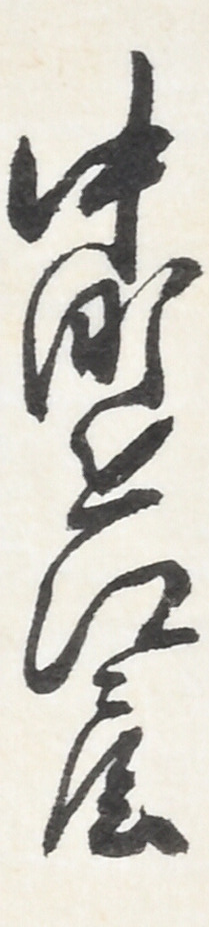中町近江屋
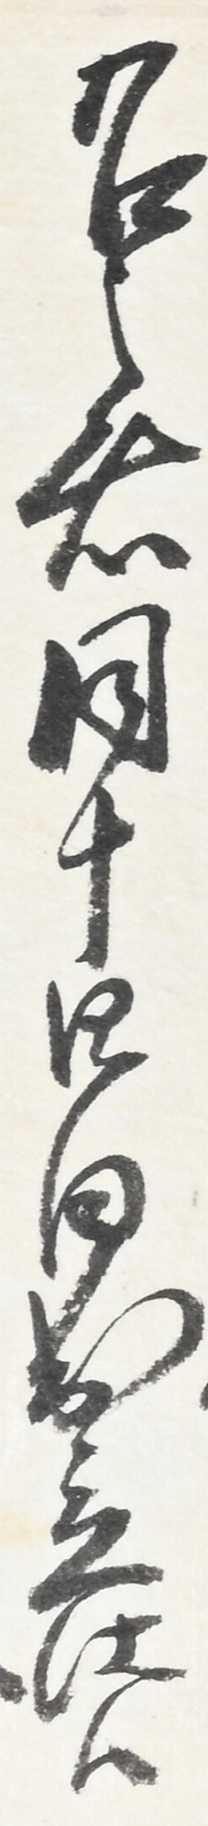右之者同十四日出立仕候

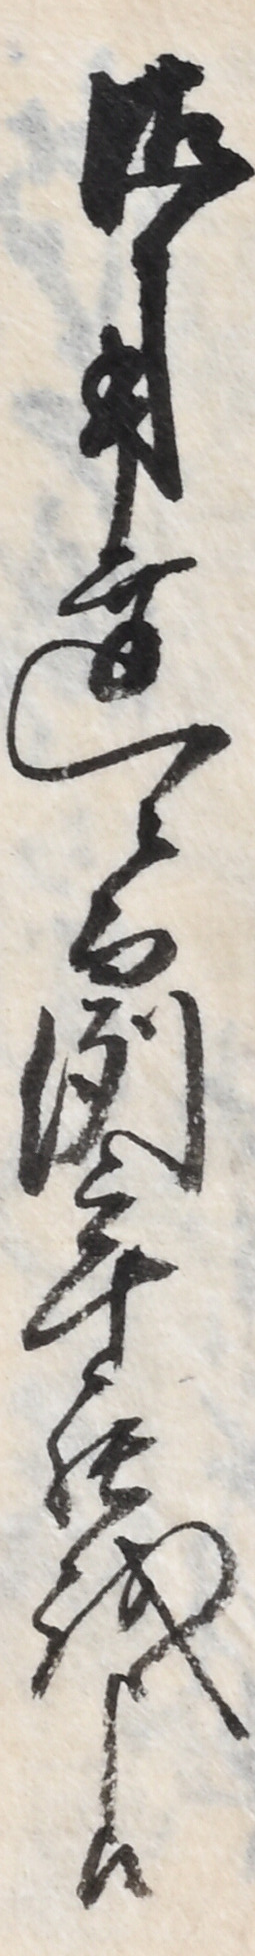椀商売ニ而例年罷越申候
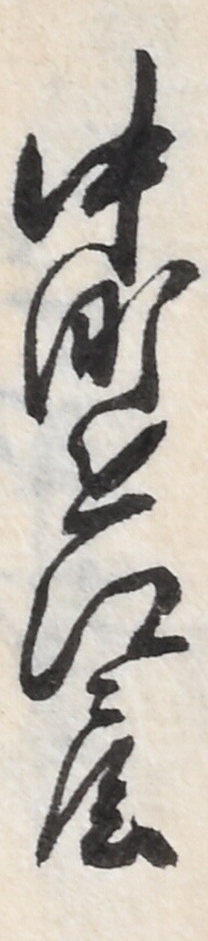中町近江屋
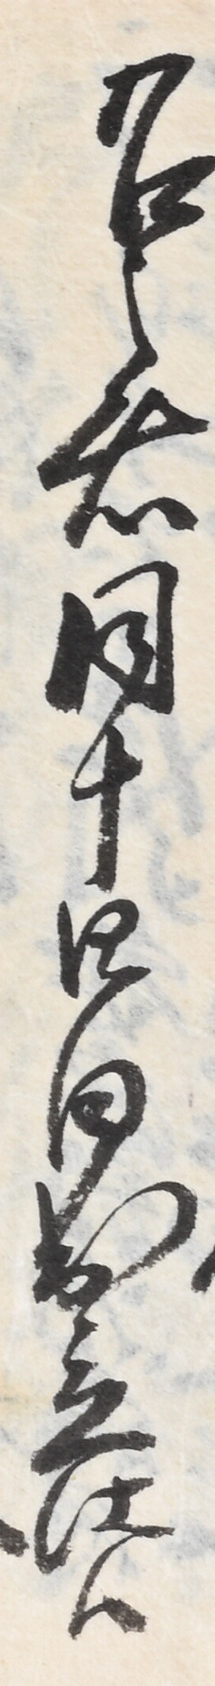右之者同廿日出立仕候
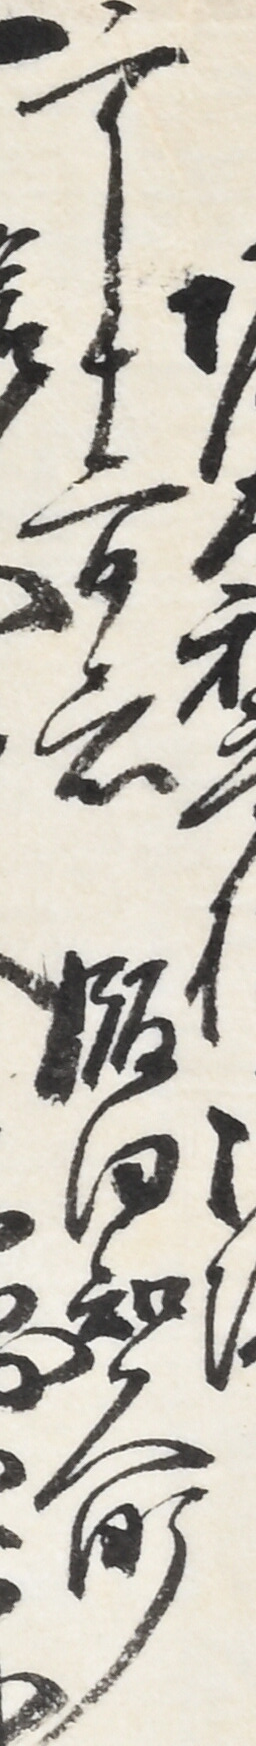二月十二日着飯田知久町
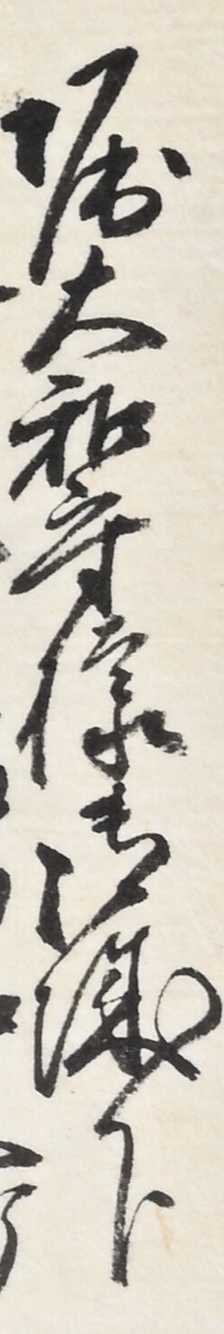堀大和守様御城下
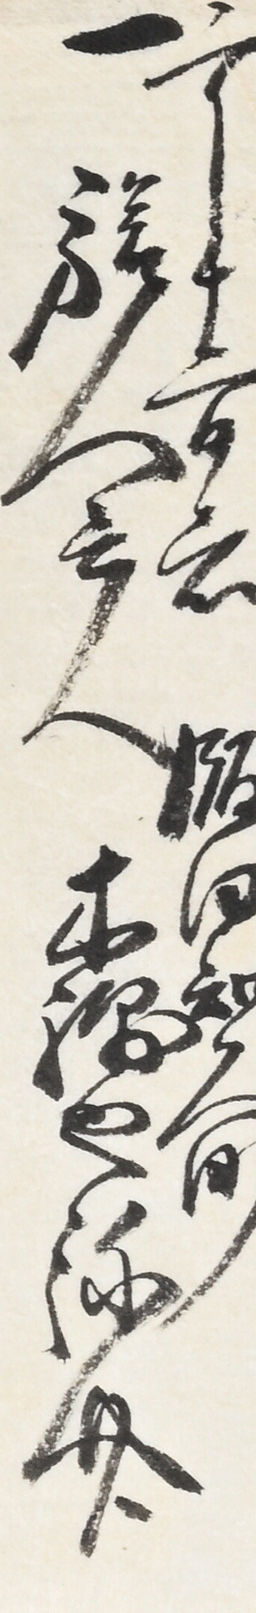一旅人壱人木綿や弥介
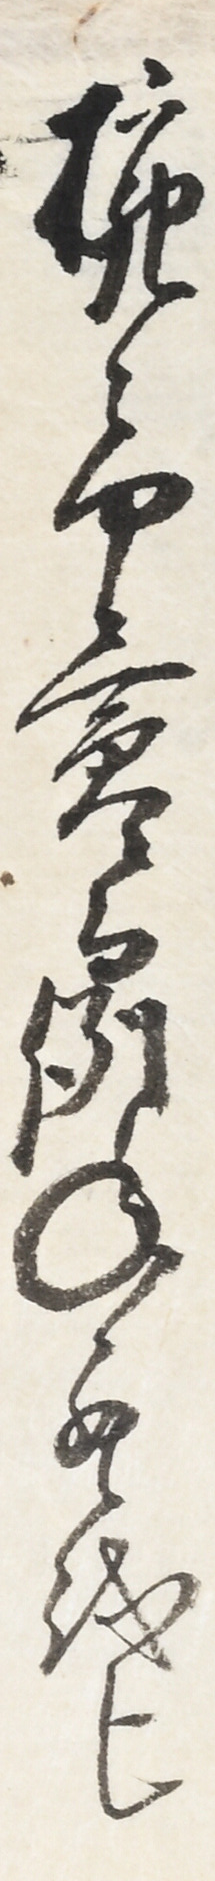椀商売ニ而例年罷越申候
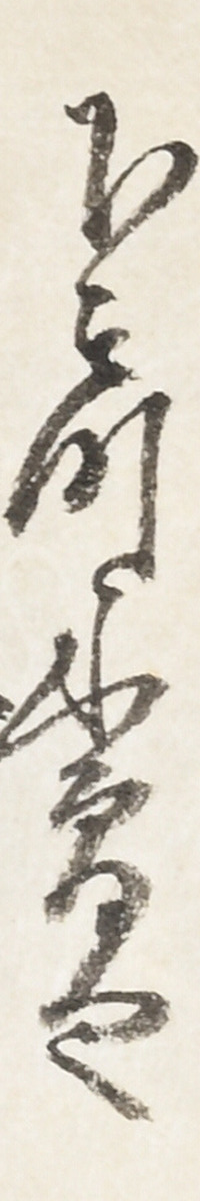下モ町木曽や
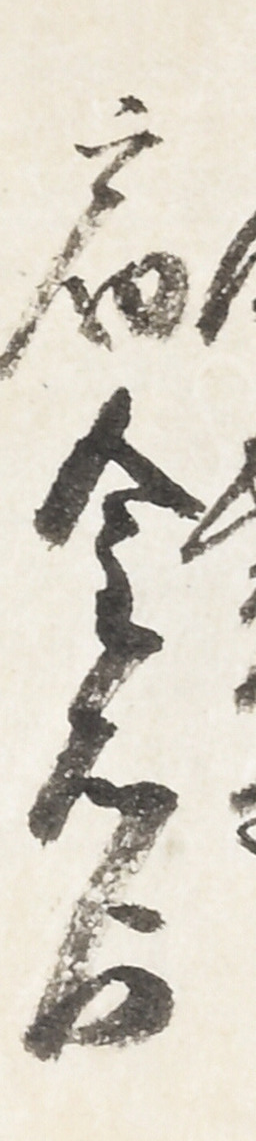宿金右衛門
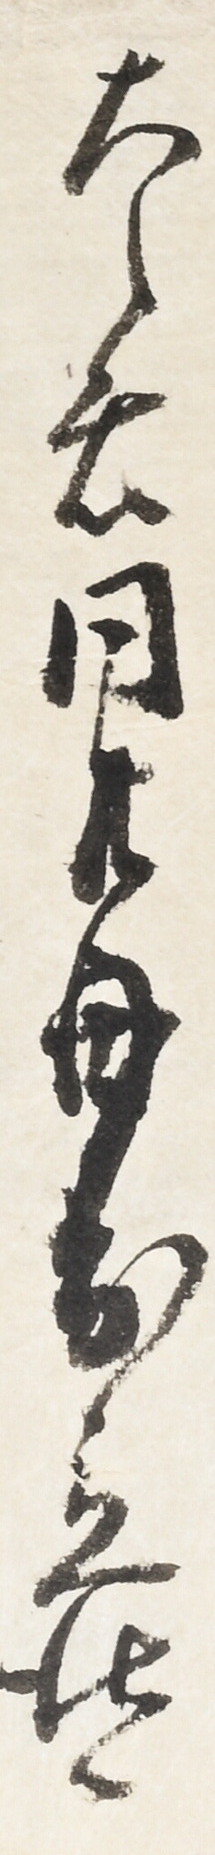右之者同廿日出立仕候
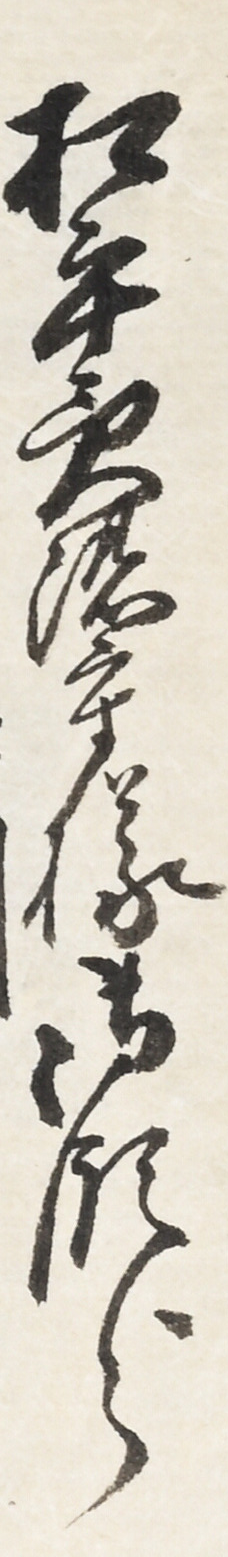松平美濃守様御領分
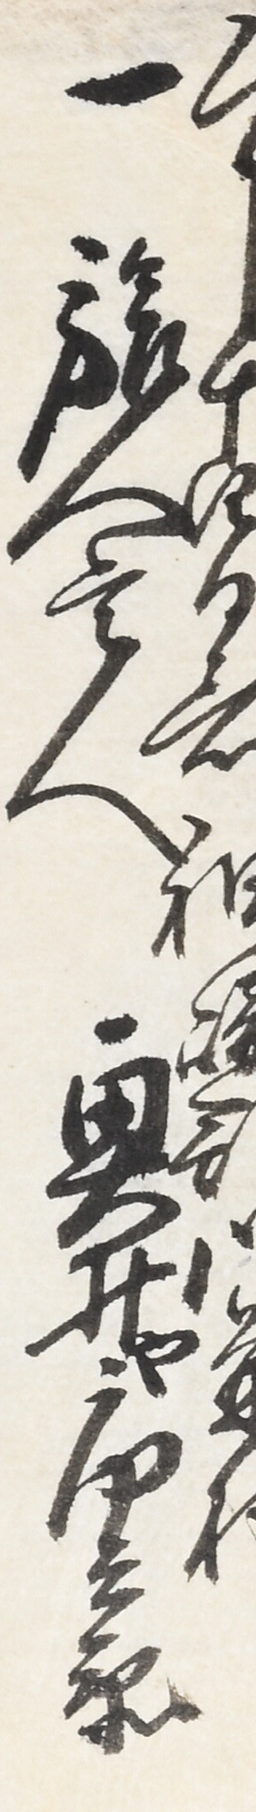一旅人壱人木綿や弥介
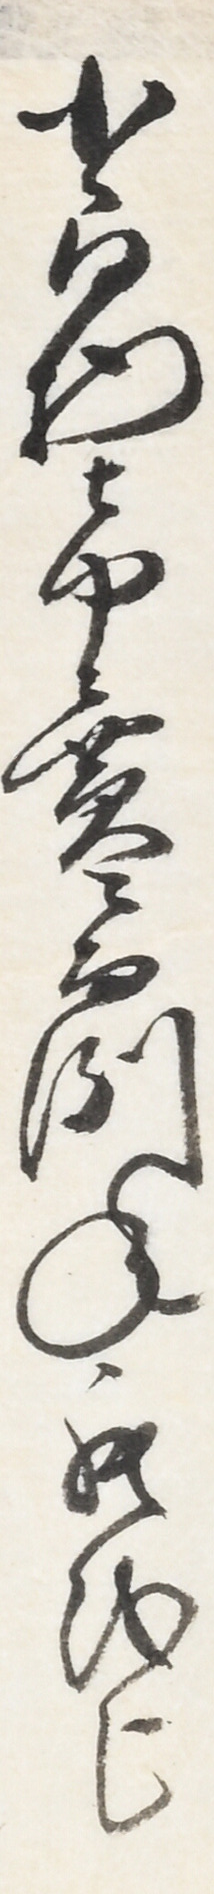小間物商売ニ而例年罷越申候
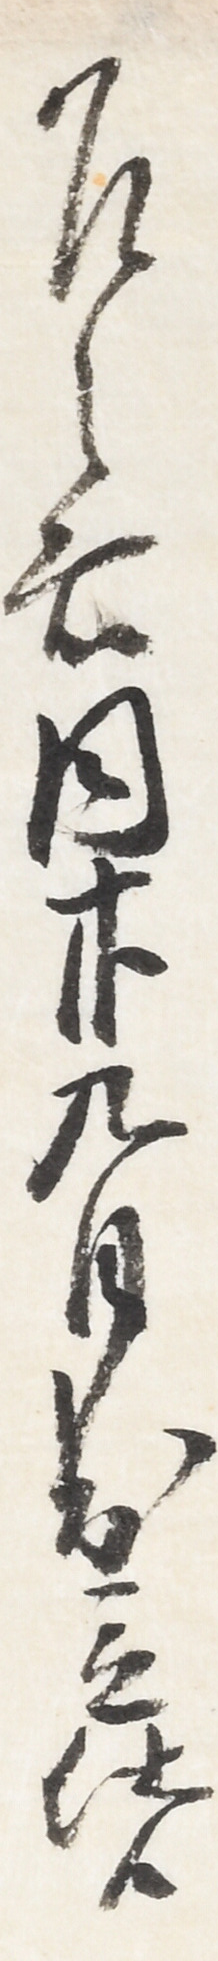右之者同廿九日出立仕候
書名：旅人泊控帳
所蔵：伊那市立高遠町図書館・合同会社AMANE
